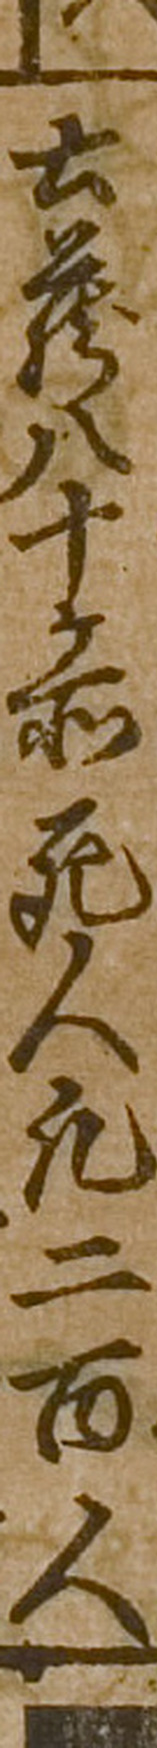土蔵八十ヶ所死人凡二百人
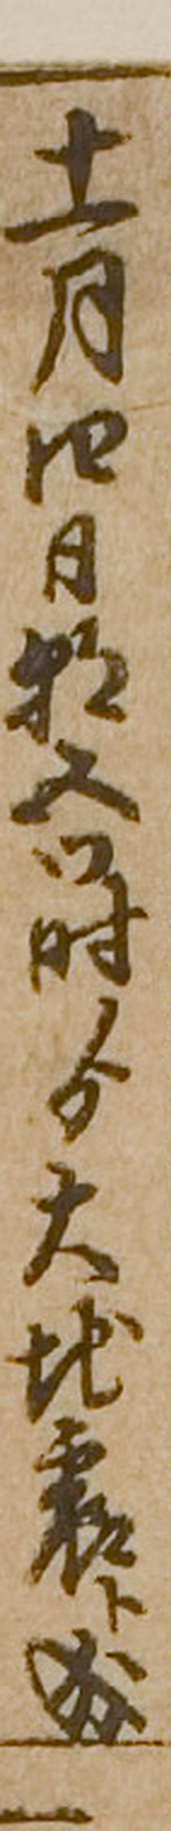十一月四日朝五ツ時ゟ大地震ト成
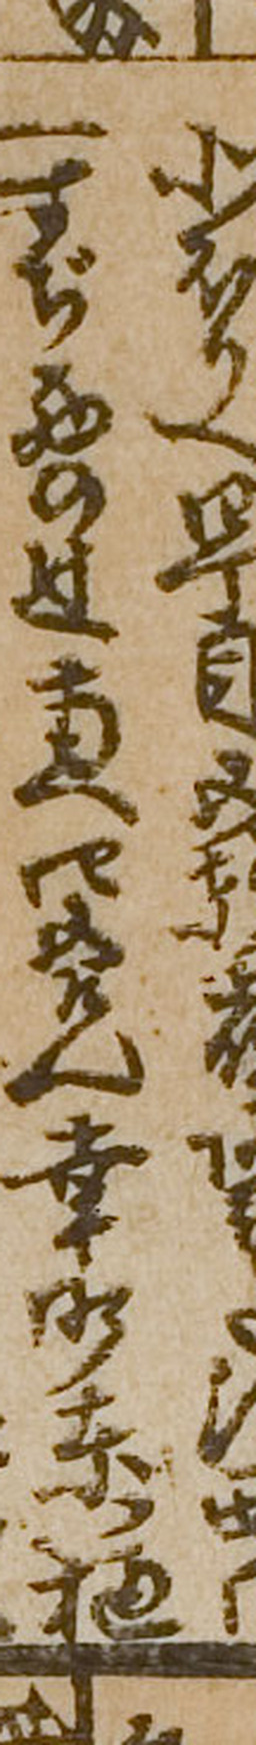一すぢ西の辻南へ四五けん幸町東樋
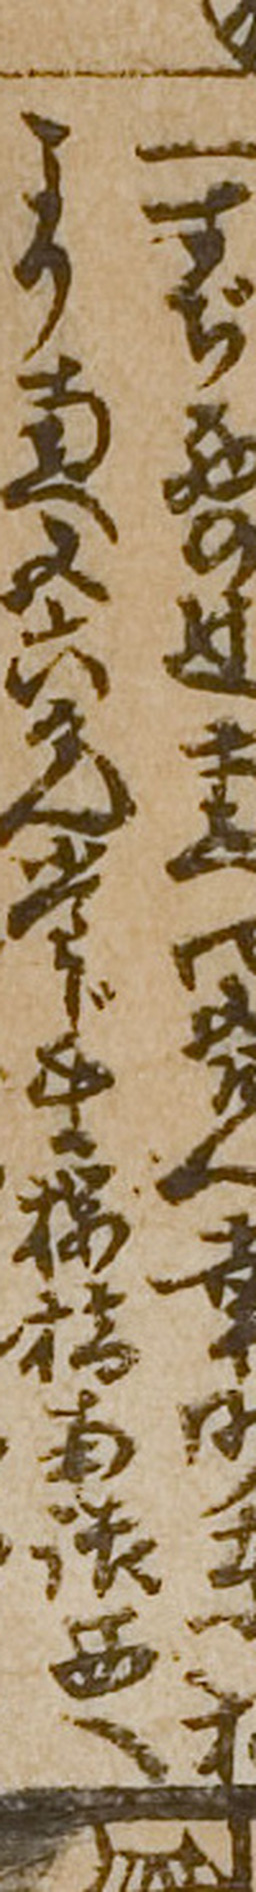より南へ五六けん堂じま桜橋南詰西へ
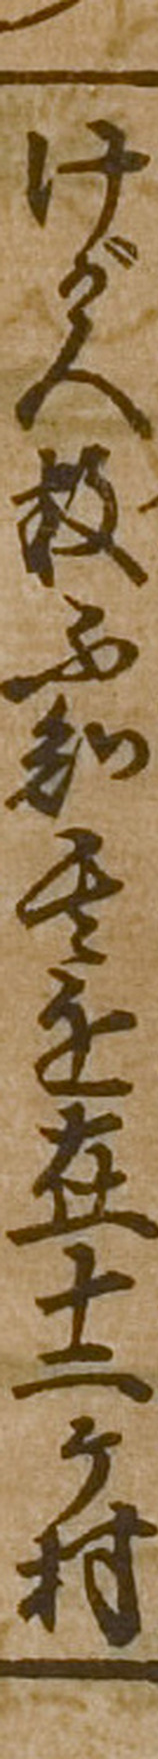けが人数不知其近在十二ヶ村
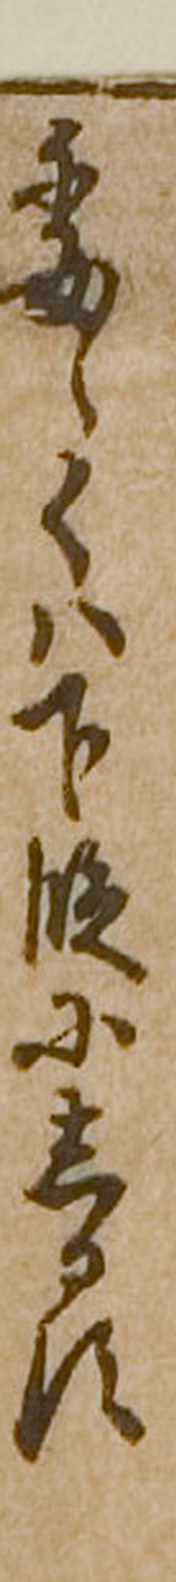委しくハ下段にしるす
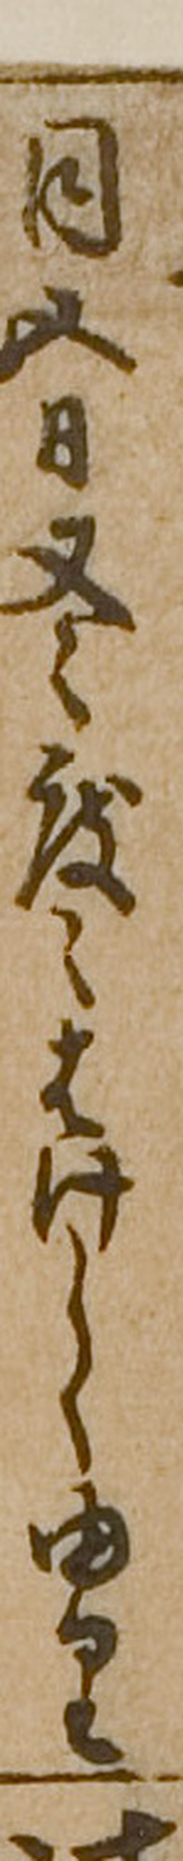同五日又々度々はけしくゆり
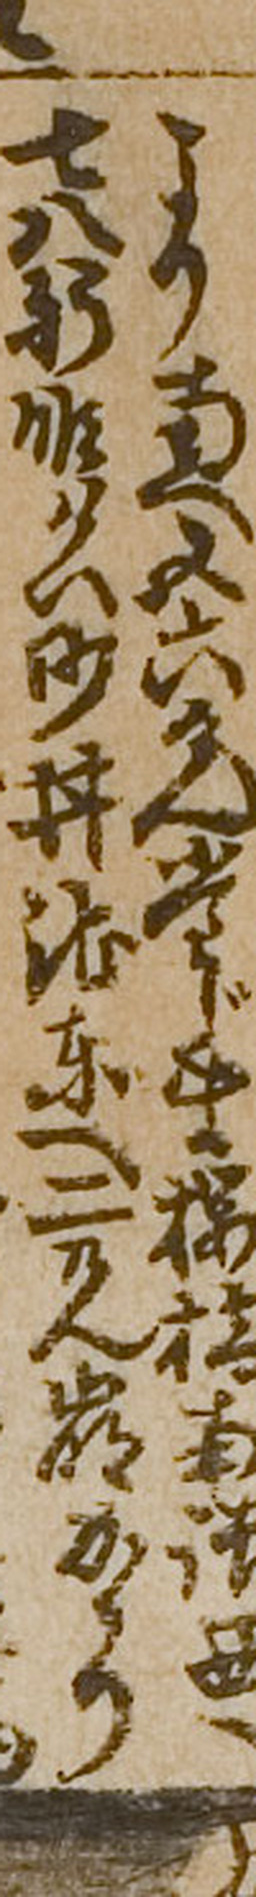七八軒順けい町丼池東へ二けん崩かゝり
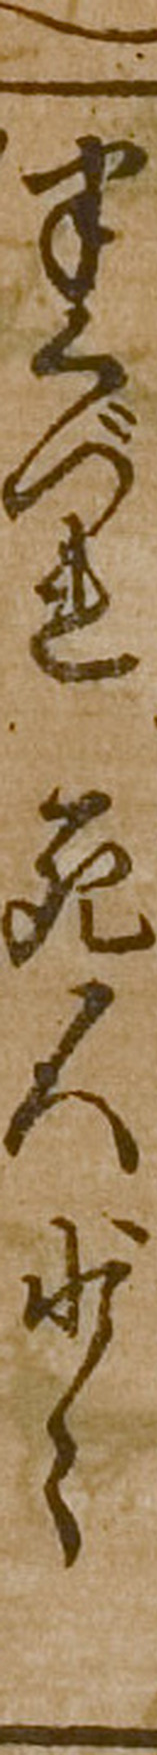半くづれ死人少々
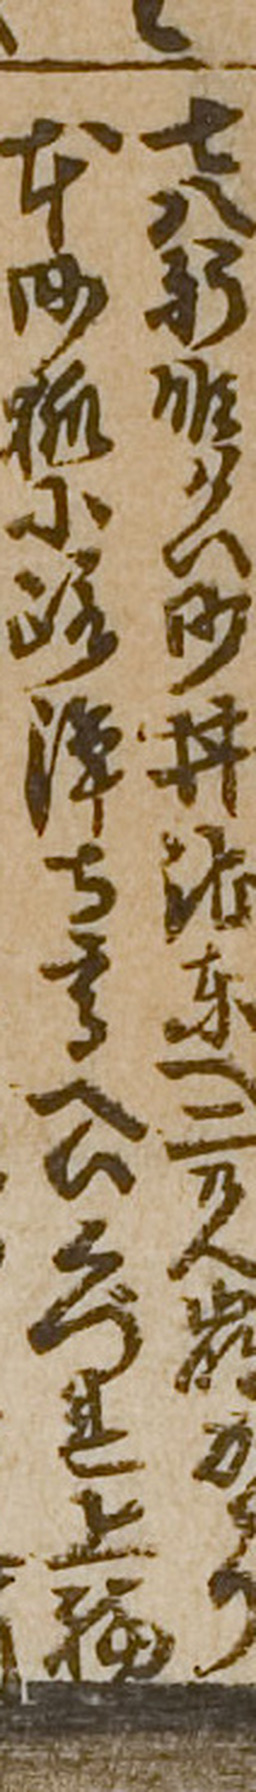本町狐小路浄寺高へいくづれ上福
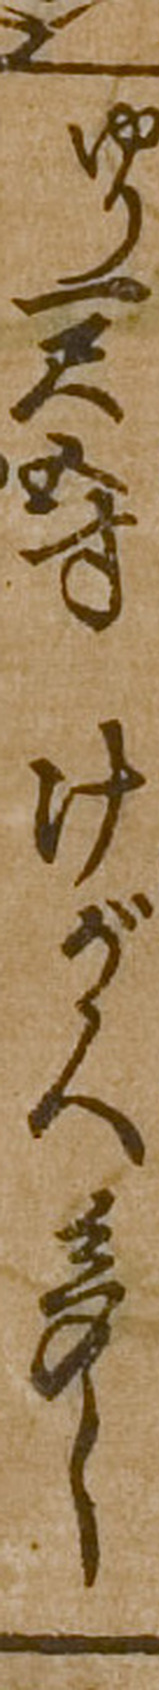ゆり一尺五寸けが人多し
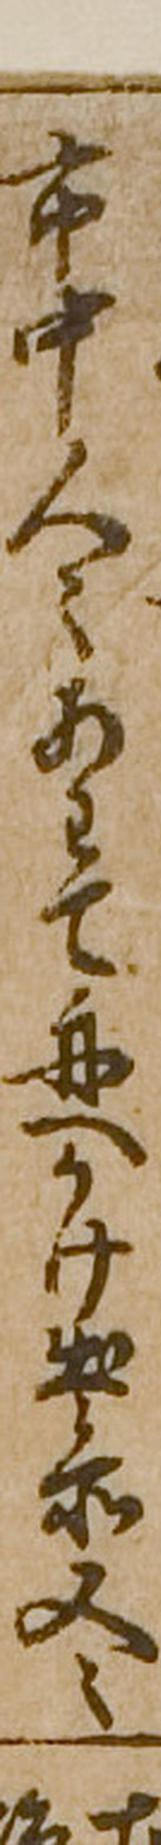市中人々あわて舟へかけ出候所又々
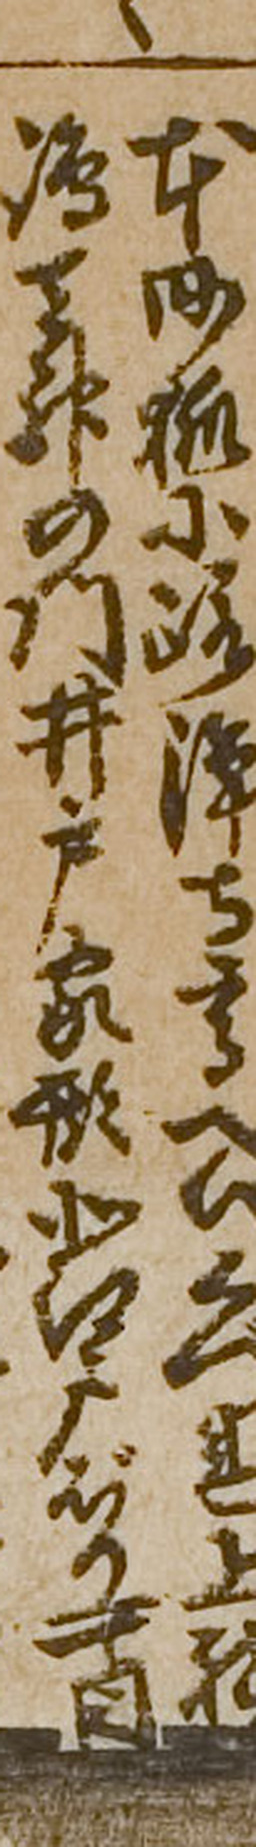嶋天神の門井戸家形北江戸ぼり一丁目
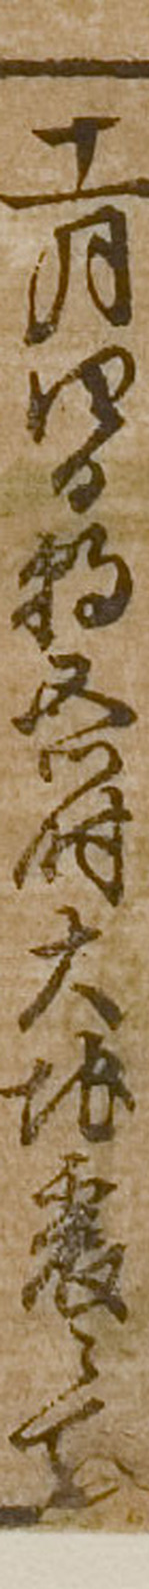十一月四日朝五ツ時大地震二て
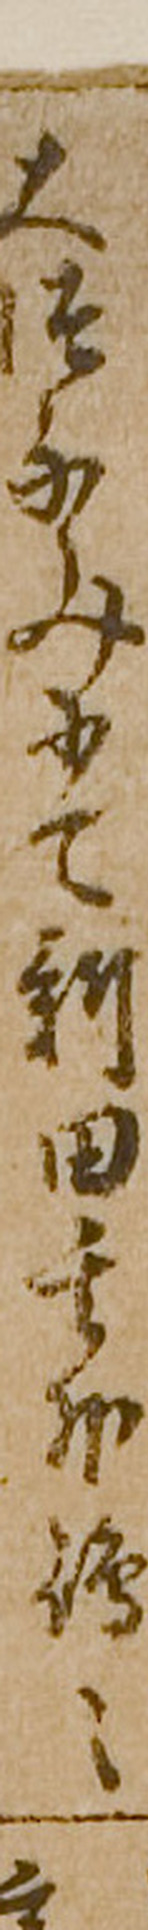大つなみにて新田其外嶋々
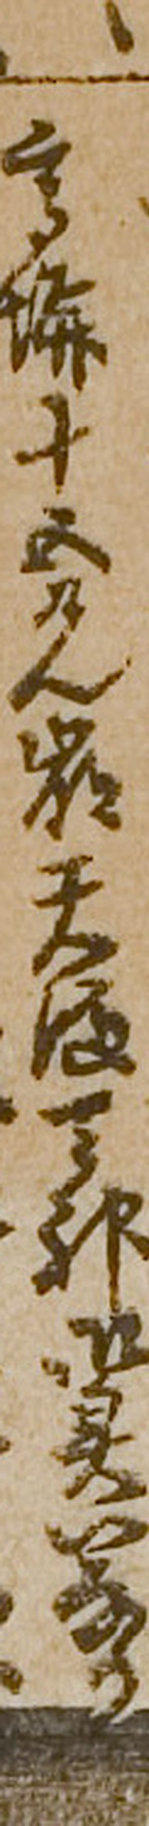高塀十五けん崩天満天神御霊いなり
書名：[大坂つなみ]
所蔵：東京大学総合図書館 General Library in the University of Tokyo, JAPAN
